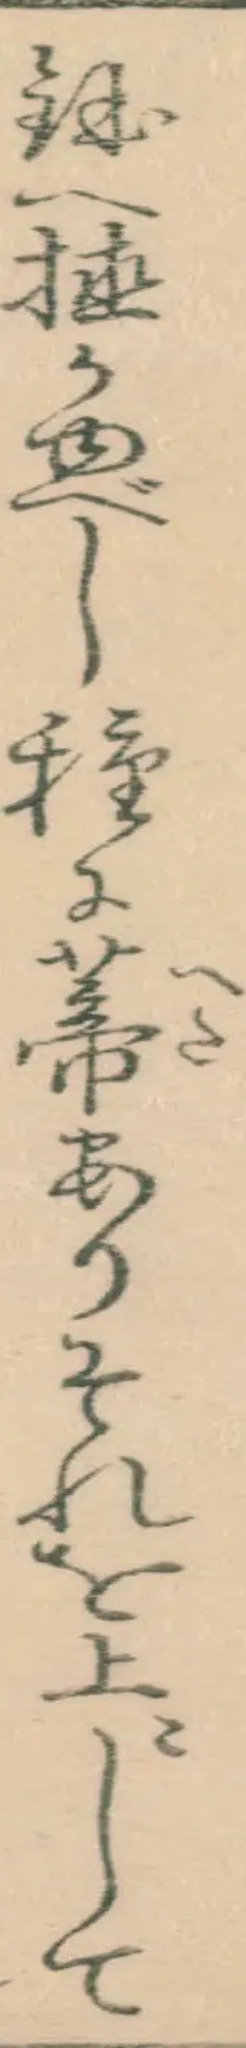鉢へ植うゆべし種に蔕ありそれを上ニして
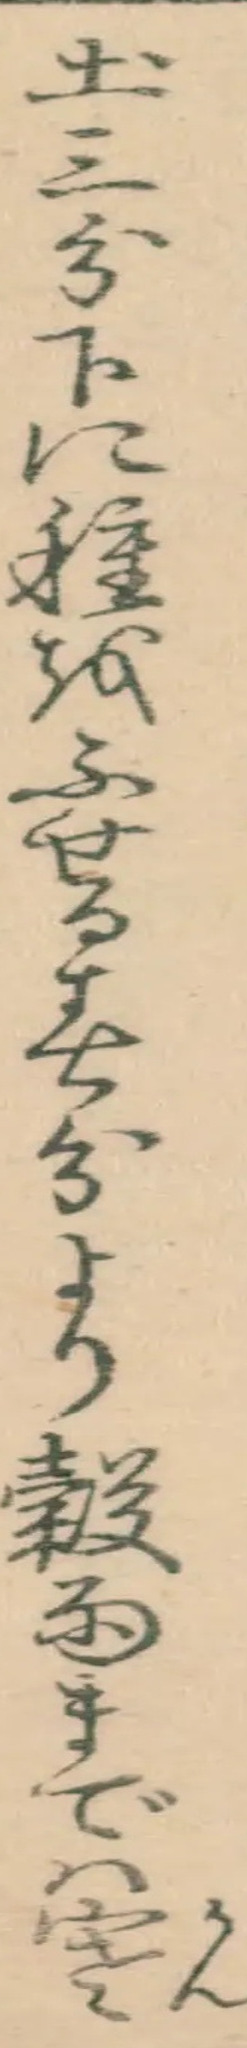土三分下に種をふせる春分より穀雨までは寒
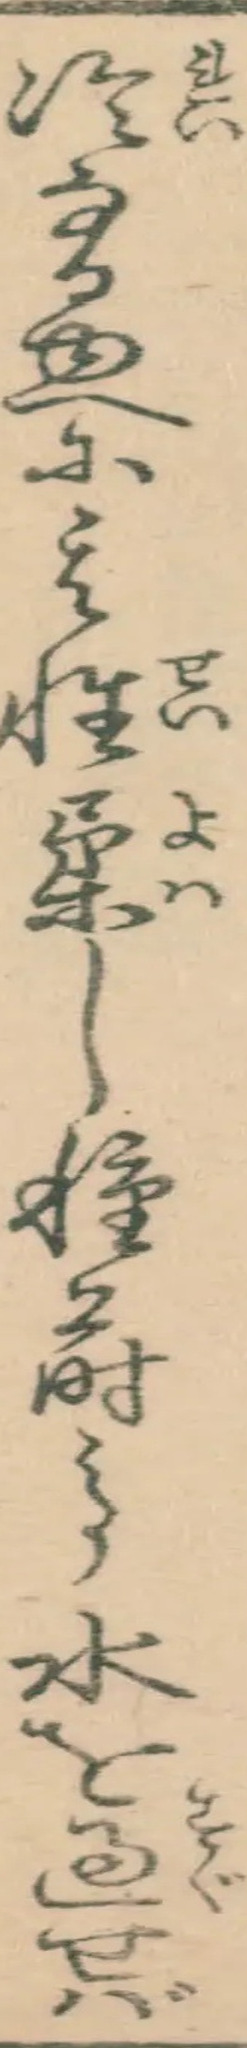冷なるゆへに其性孱し種蒔て水を過せバ
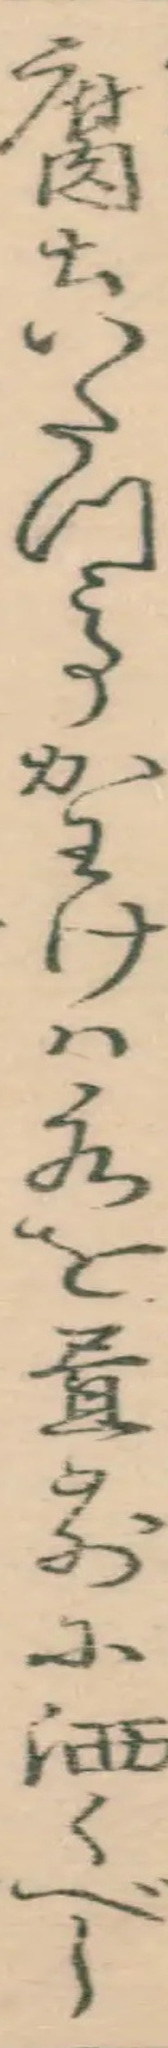腐土いたつてかわけハ水を昼前に洒くべし
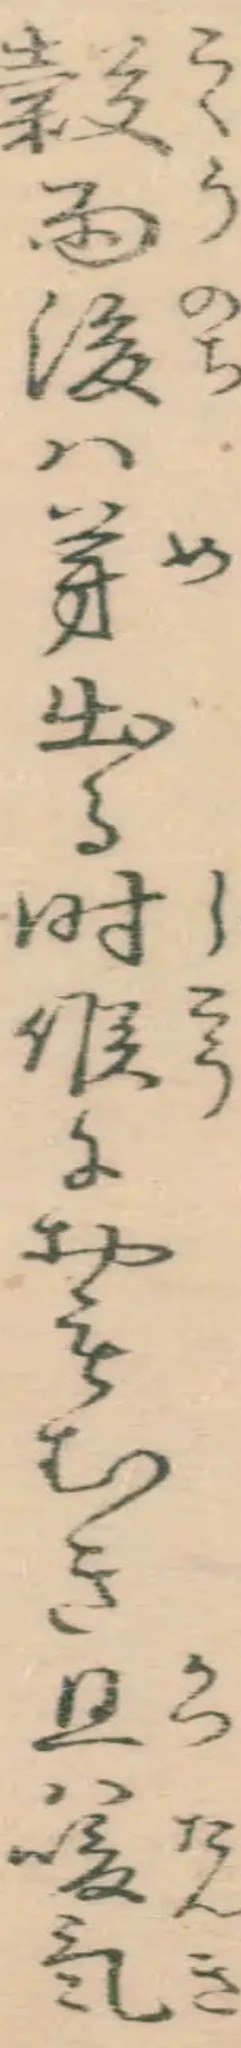穀雨後ハ芽出る時候におもむき且ハ暖気
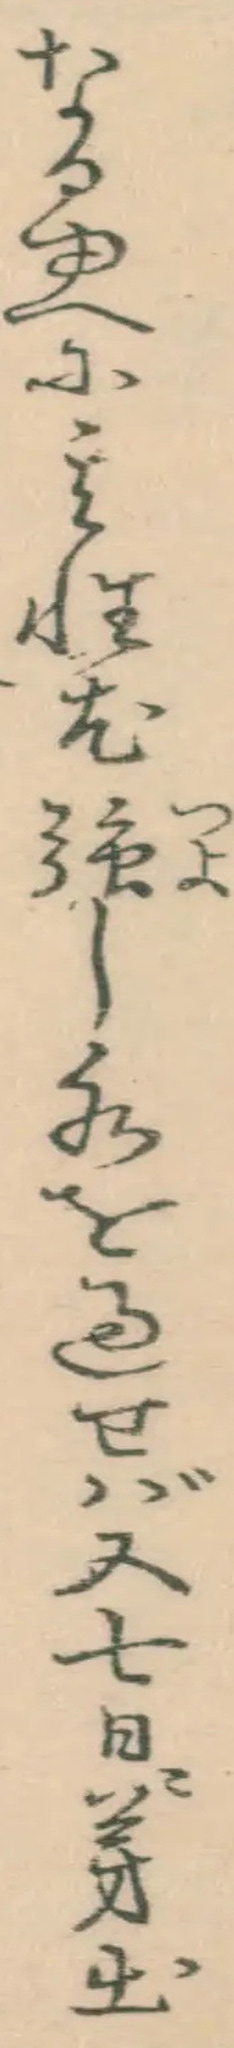なるゆへに其性尤強し水を過せバ又七日ニ芽出
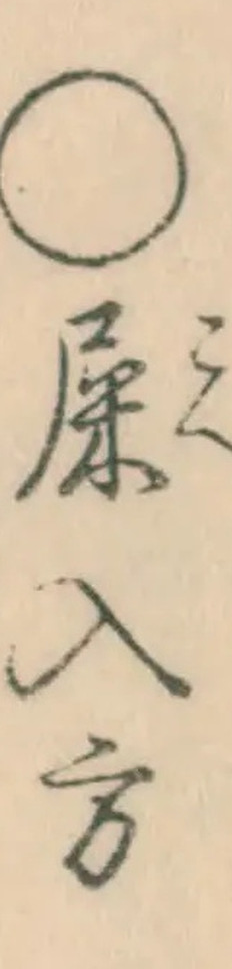〇屎入方
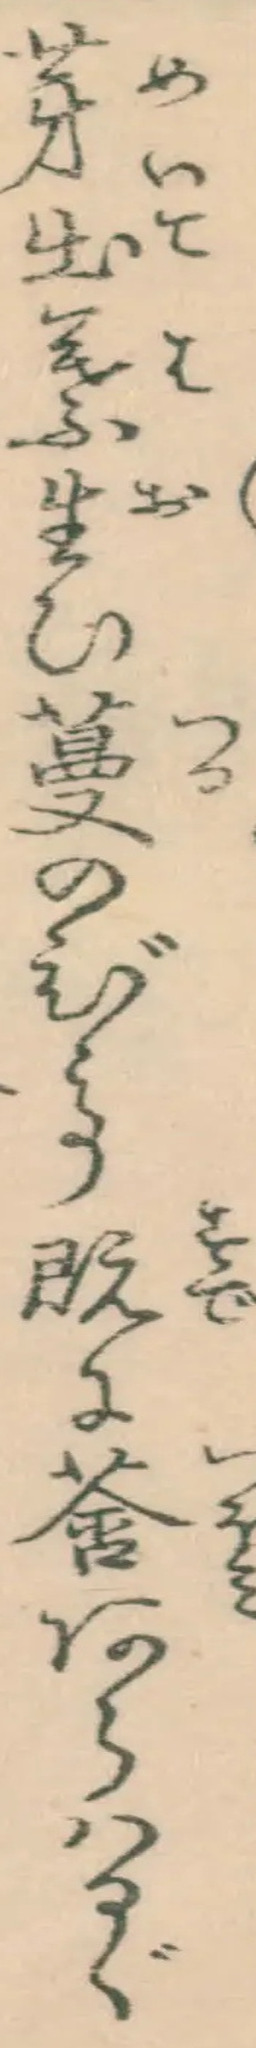芽出葉生ひ蔓のびて既に莟あらハるゝ
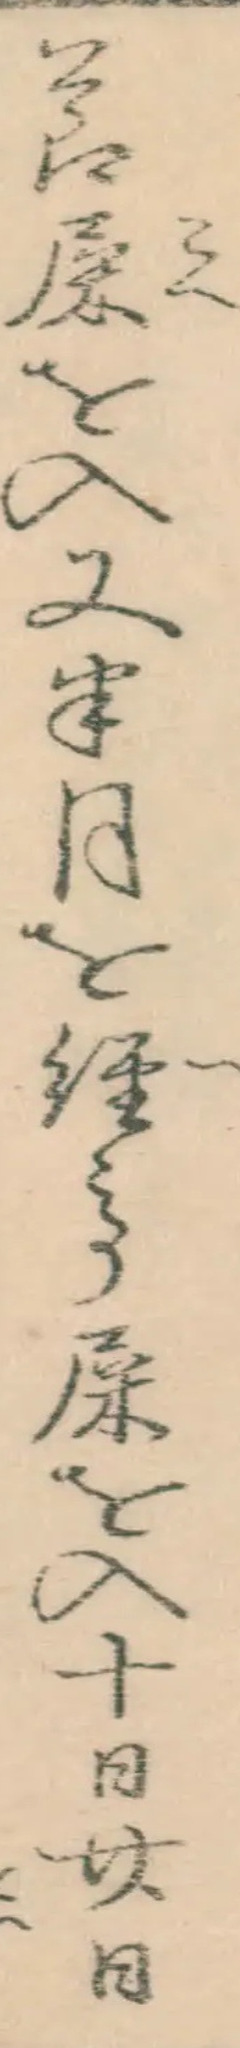節屎を入又半月を経て屎を入十日廿日
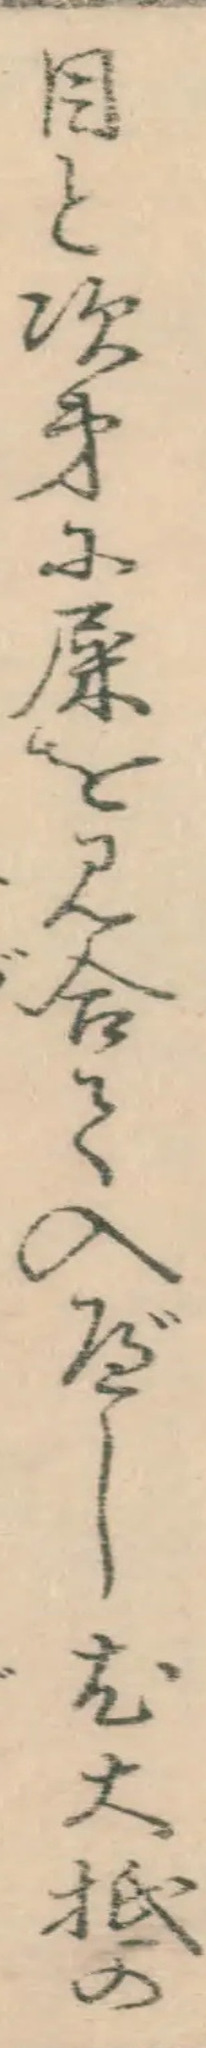目と次第に屎を見合て入べし尤大抵の
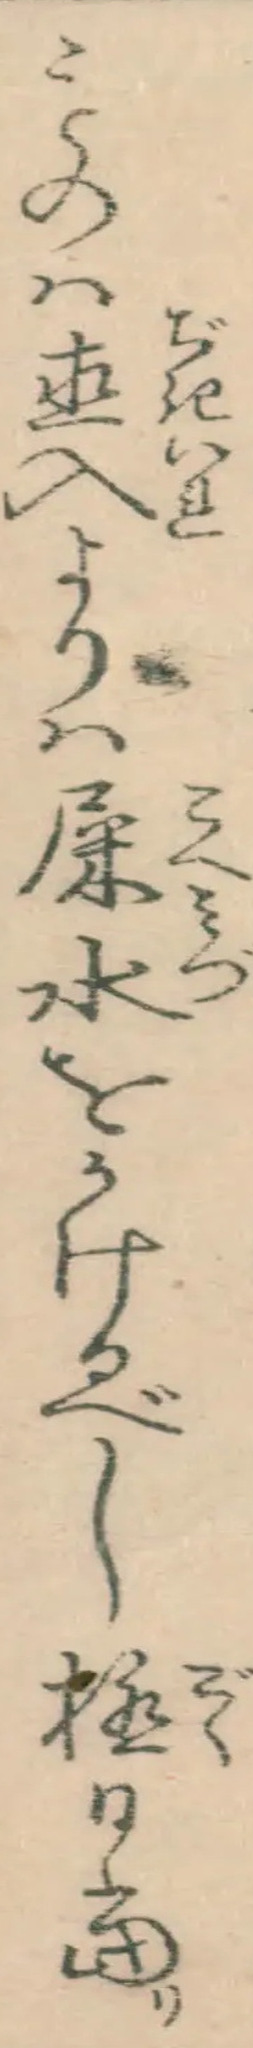ものハ直入よりハ屎水をかけるべし極日当り

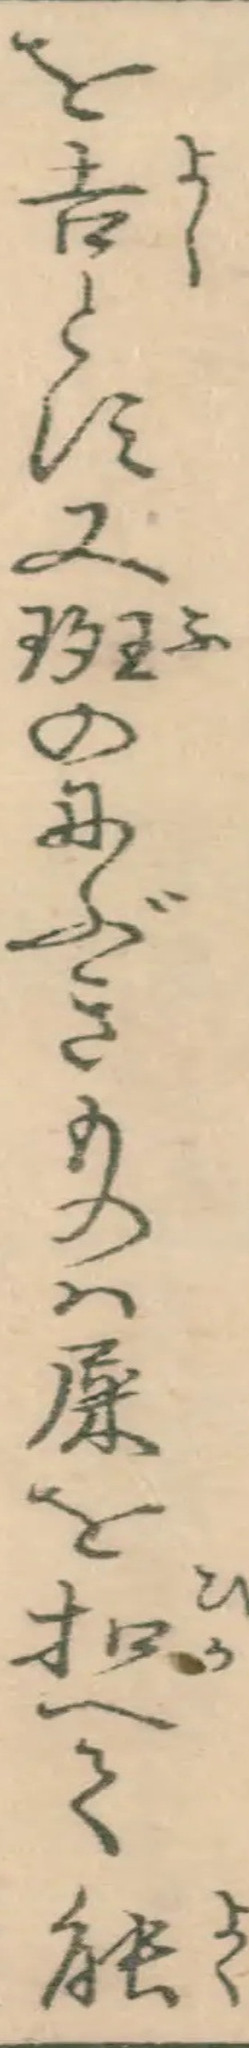を吉とす又斑のにぶきものハ屎を扣へて能
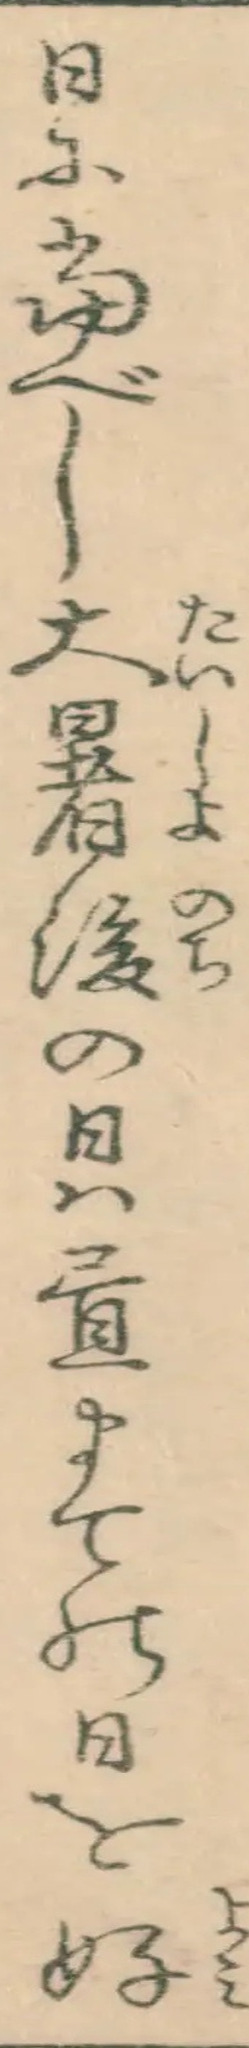日に当べし大暑後の日ハ昼まての日を好
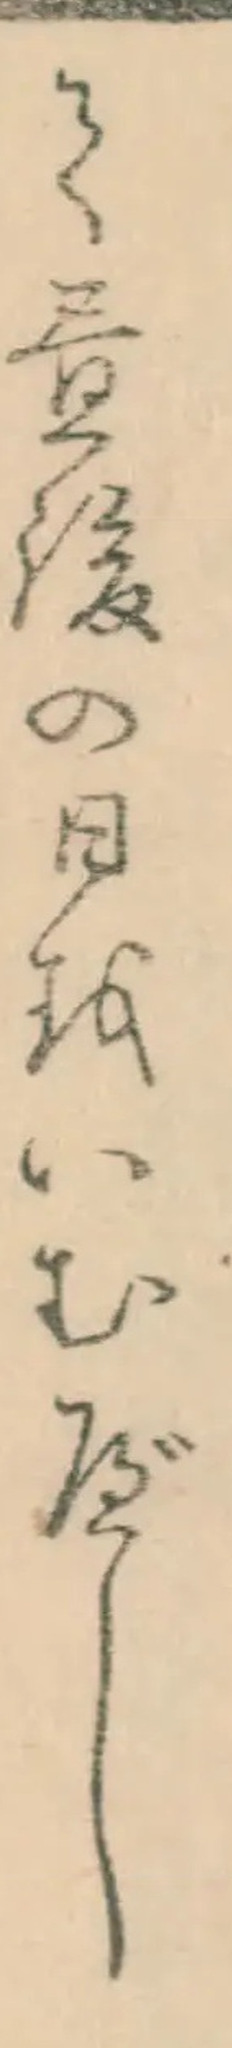て昼後の日いむべし
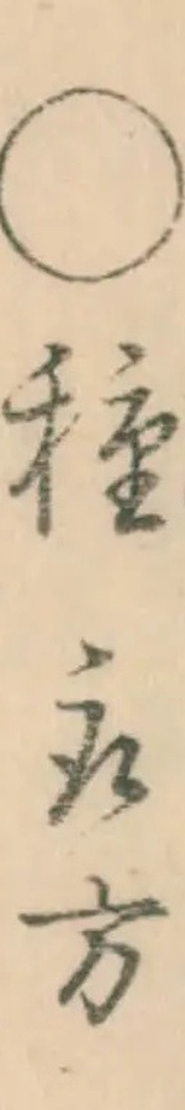〇種取方
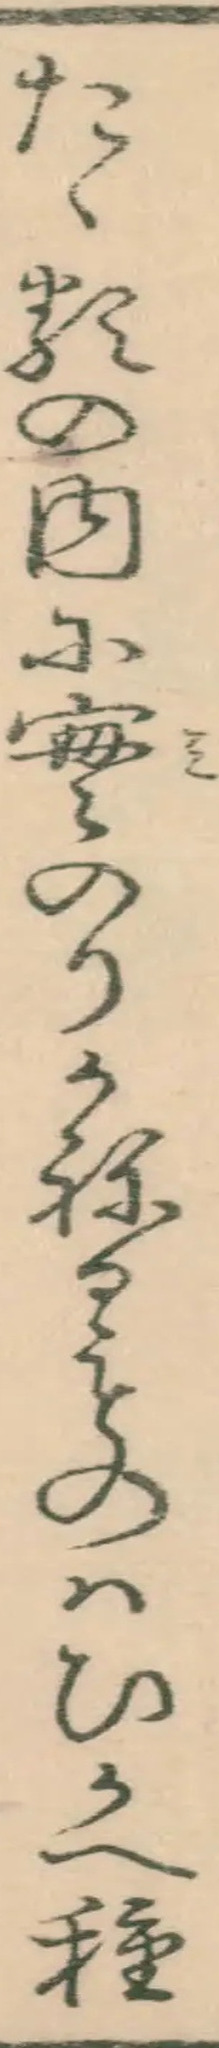たゝ類の内に実のりかねることのハひかへ種
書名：花壇朝顔通 2巻. [2]
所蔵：国立国会図書館 National Diet Library, JAPAN
